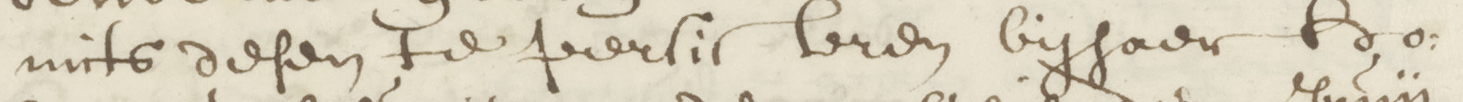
mits desen te persisteren bij haer Ho:
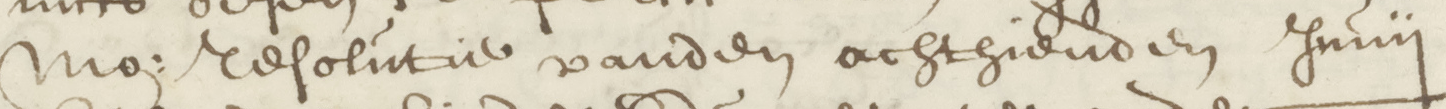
Mo: resolutie vanden achthienden Junij
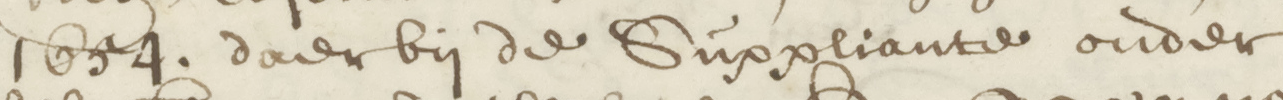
1654. daerbij de Suppliante onder
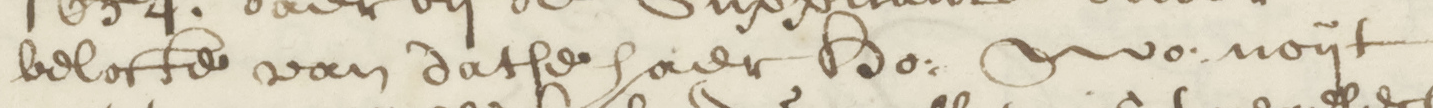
belofte van datse haer Ho:Mo: noijt
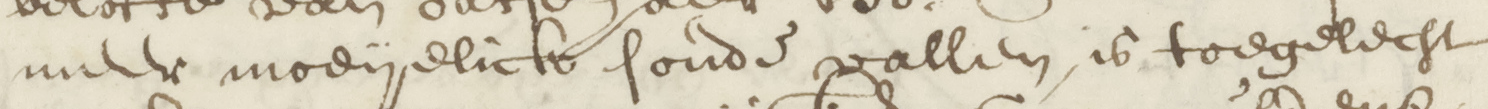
meer moeijelick soude vallen, is toegelecht
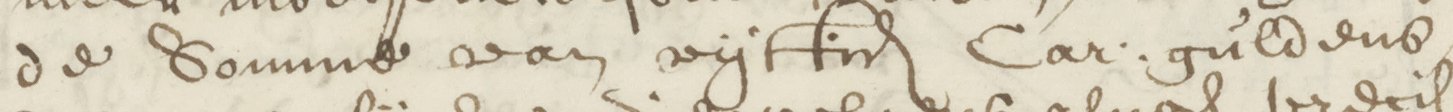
de Somme van vijftich Car. guldens
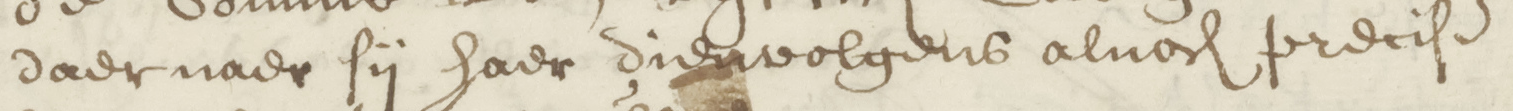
daer naer sij haer dienvolgens alnoch precise
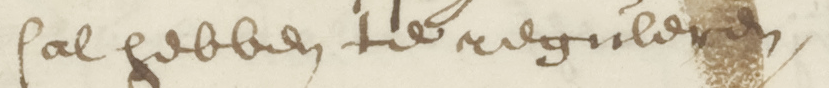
sal hebben te reguleren.
